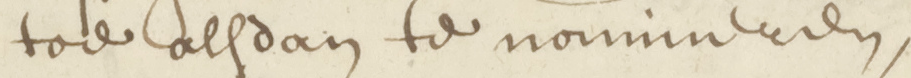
toe alsdan te nomineren.
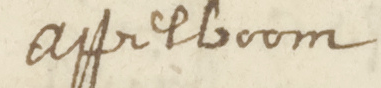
Appelboom
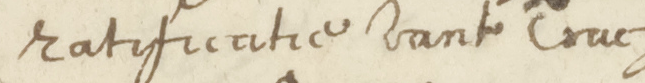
ratificatie vant Trac„
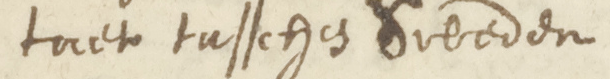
taet tusschen Sweden
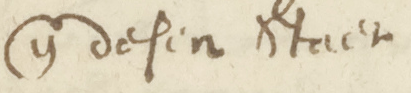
& desen Staet
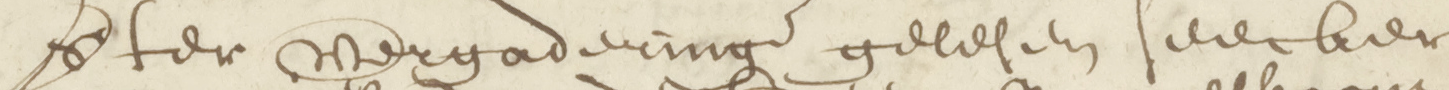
Is ter Vergaderinge gelesen seecker
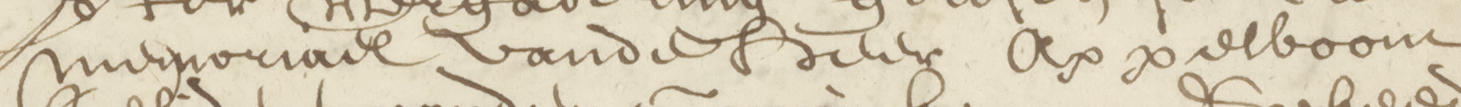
memoriael vande Heer Appelboom
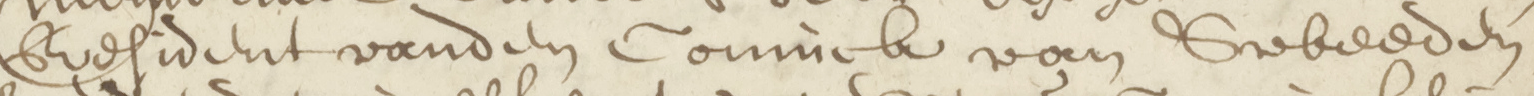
Resident vanden Coninck van Sweeden
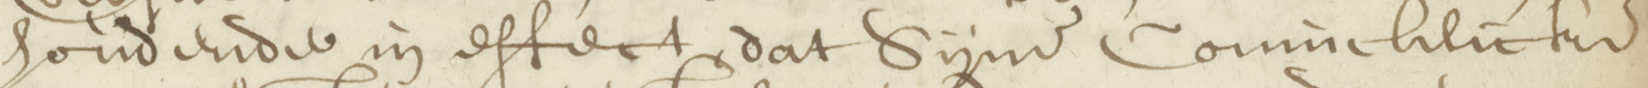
houdende in efect, dat Sijne Conincklicke
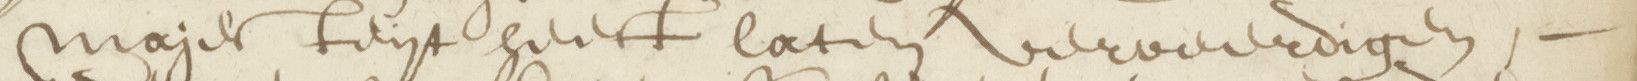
Majesteijt heeft laten verveerdigen, —
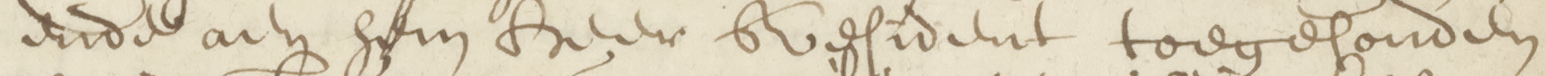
ende aen hem Heer Resident toegesonden
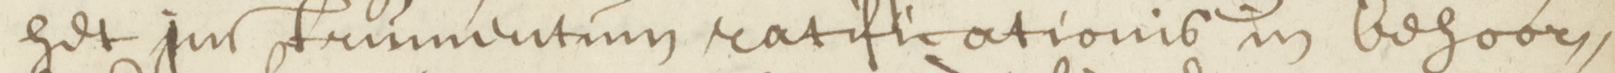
het Instrumentum ratificationis in behoor„
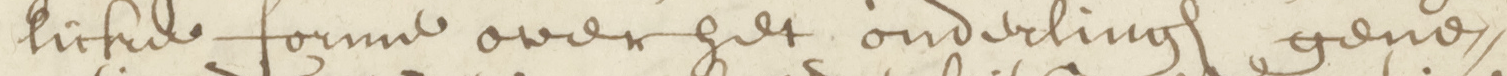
licke forme over het onderlingh gene„
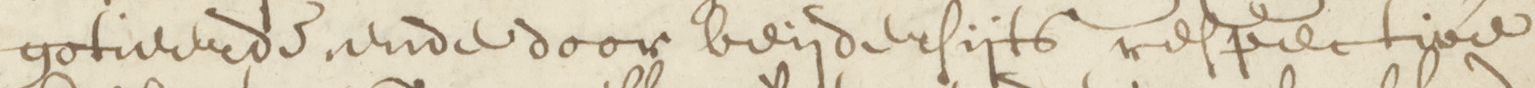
gotieerde ende door beijdersijts respective
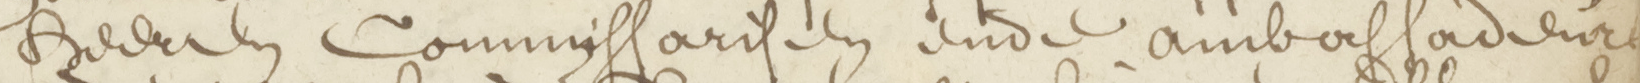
Heeren Commissarisen ende Ambassadeurs
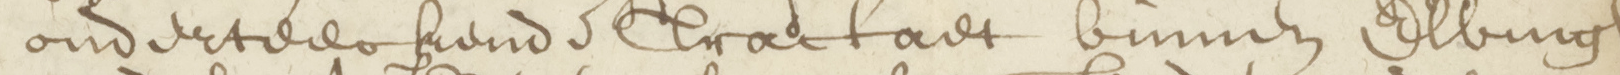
onderteeckende Tractaet binnen Elburgh
